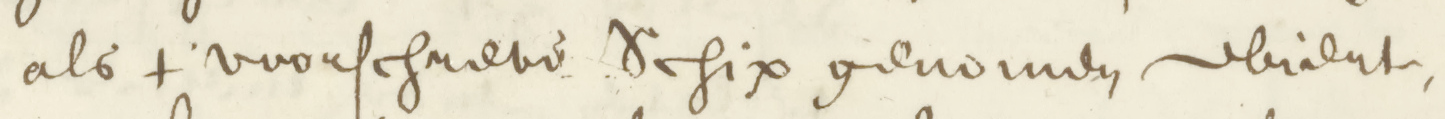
als t'voorschreve Schip genomen wiert,
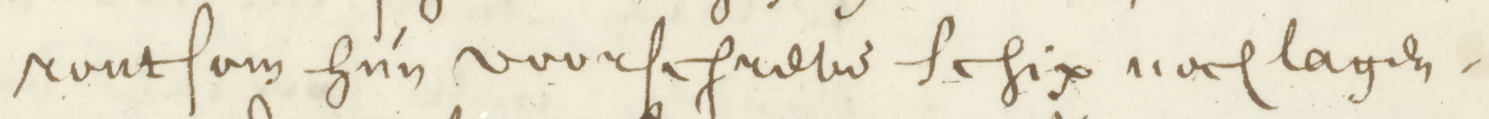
rontsom hun voorschreve schip noch lagen,
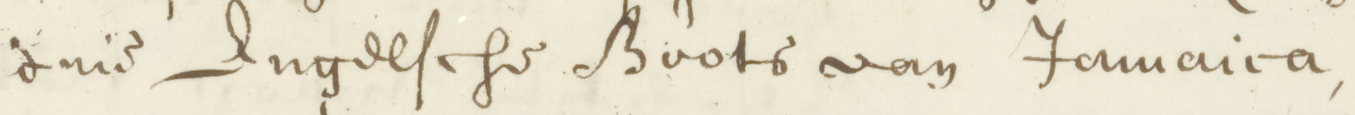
drie Engelsche Boots van Jamaica,
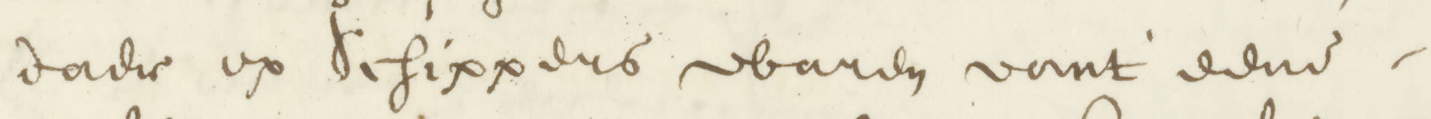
daer op Schippers waren vant‛ eene
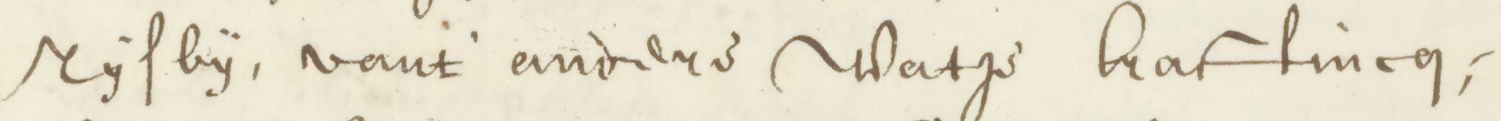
Rijsbij, vant andere Watje Kaffincq;
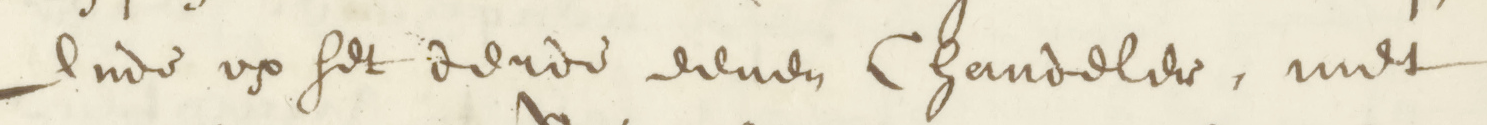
ende op het derde eenen Chandeler, met
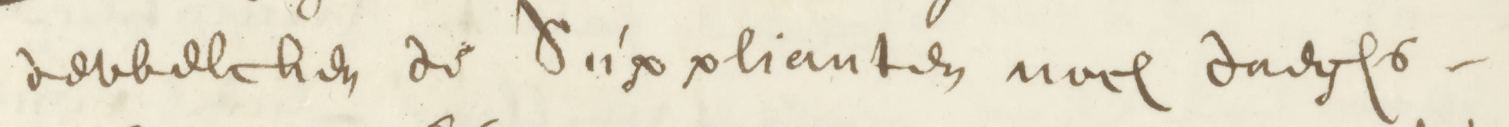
dewelcken de Supplianten noch daeghs
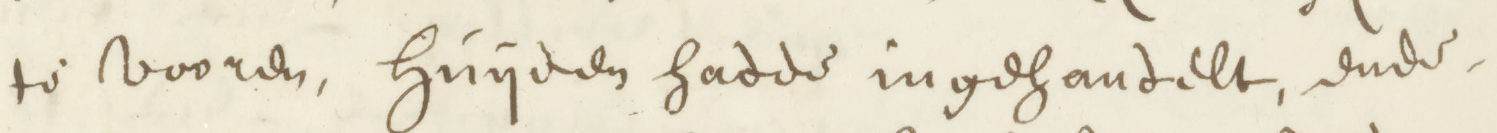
te vooren, huijden hadde ingehandelt, ende
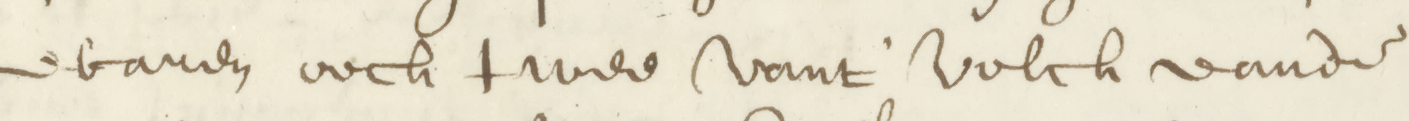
waren oock twee vant‛ Volck vande
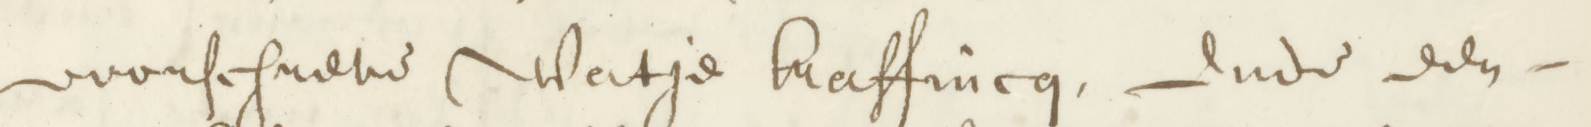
voorschreve Watje Kaffincq, ende een
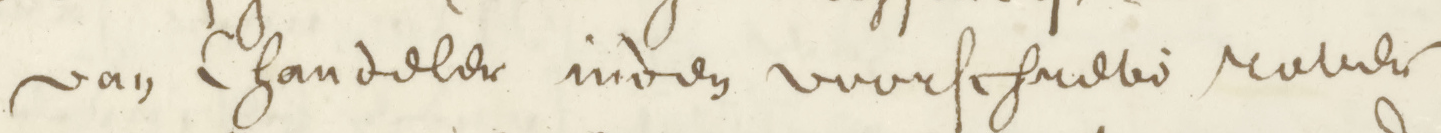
van Chandeler inden voorschreve rover,
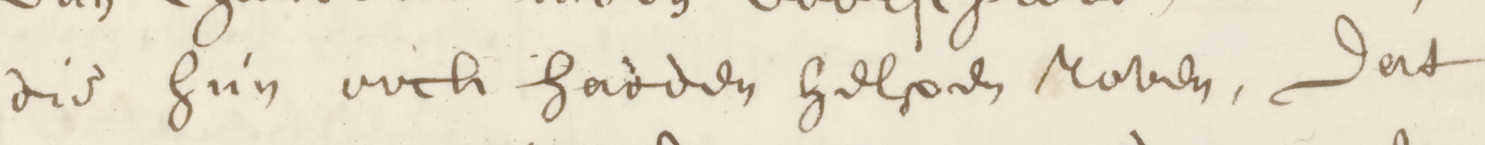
die hun oock hadden helpen roven. Dat
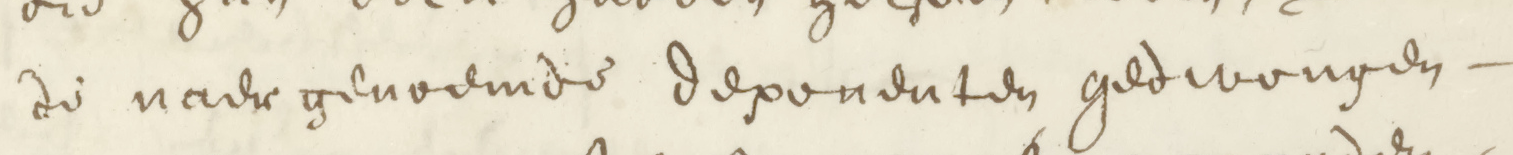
die naer genoemde deponenten gedwongen
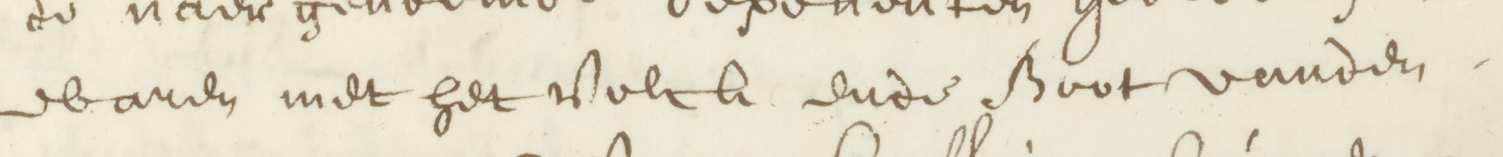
waren met het Volck ende Boot vanden
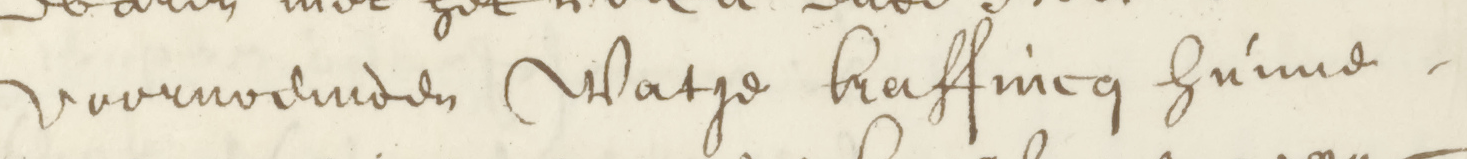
voornoemden Watje Kaffincq hunne
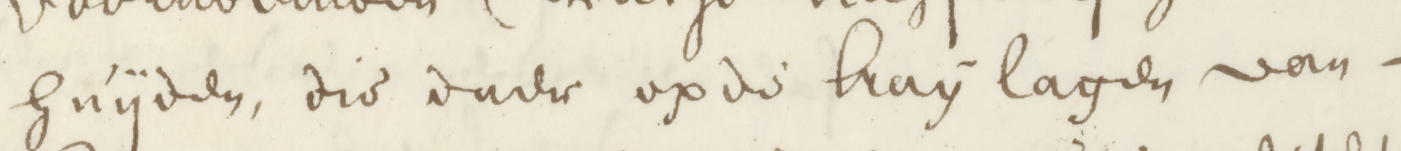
huijden, die daer opde kaij lagen van
